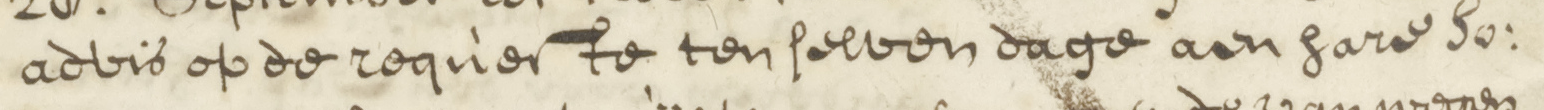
advis op de requeste ten selven dage aen hare Ho:
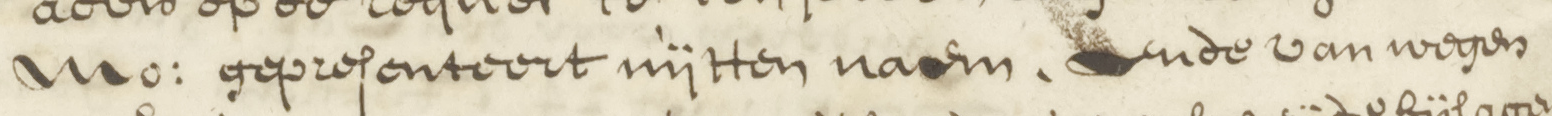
Mo: gepresenteert uijtten naem, Ende van wegen
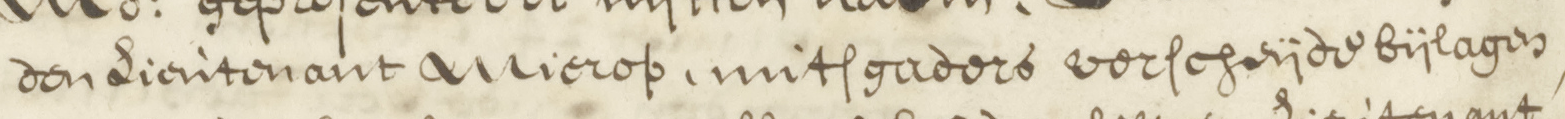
den Lieutenant Mierop, mitsgaders verscheijde bijlagen
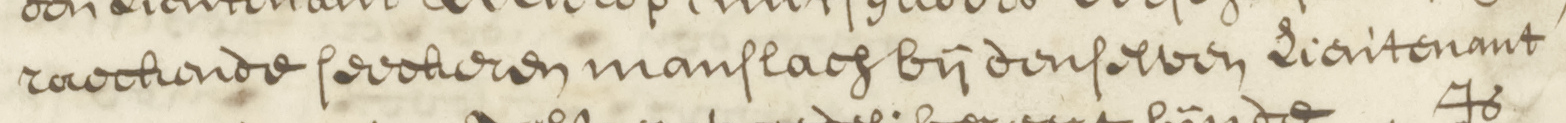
raeckende seeckeren manslach bij denselven Lieutenant
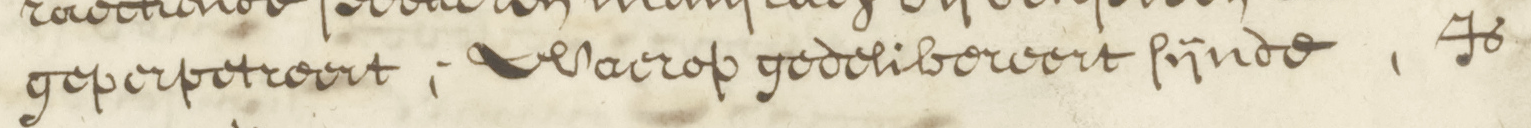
geperpetreert; Waerop gedelibereert sijnde, Is
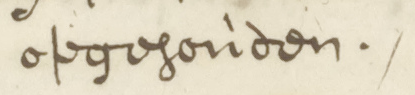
opgehouden.
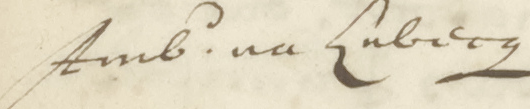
Ambr. na Lubecq
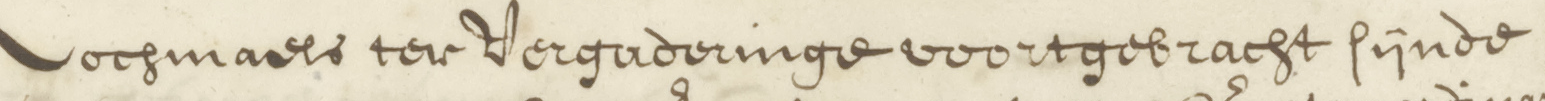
Nochmaels ter Vergaderinge voortgebracht sijnde,
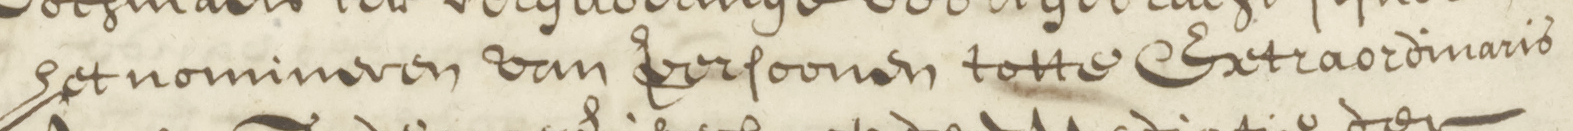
het nomineren van persoonen totte Extraordinaris
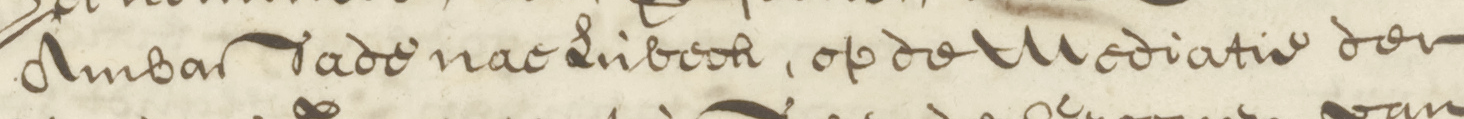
Ambassade nae Lubeck, op de Mediatie der
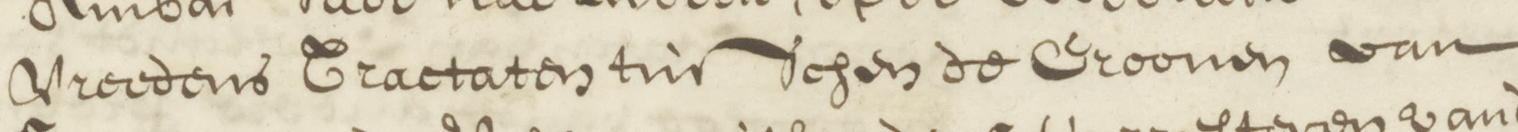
Vreedens Tractaten tusschen de Croonen van
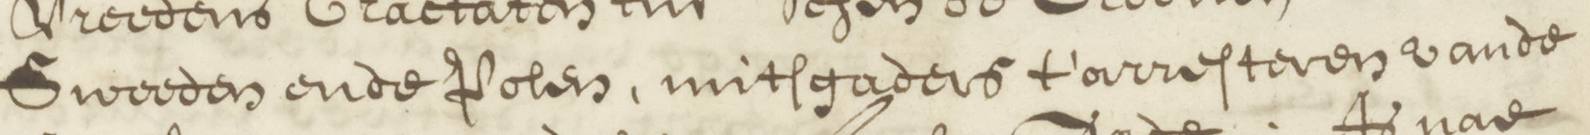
Sweeden ende Polen, mitsgaders t'arresteren van de
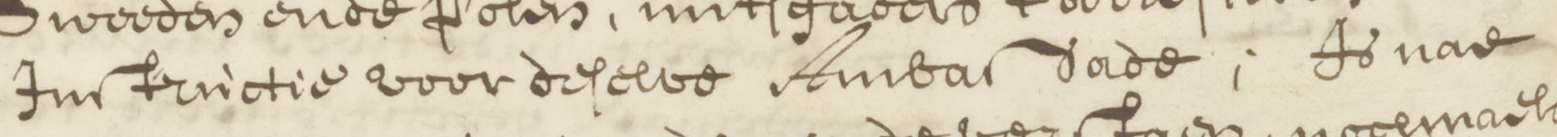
Instructie voor deselve Ambassade; Is nae
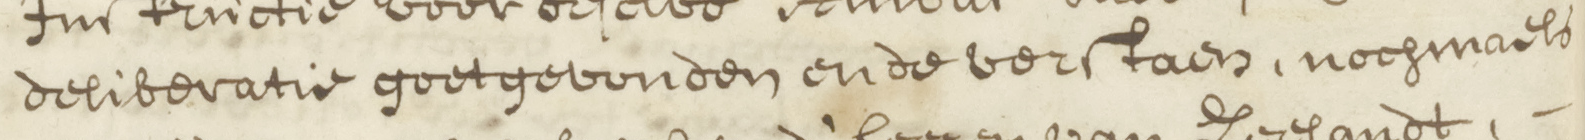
deliberatie goetgevonden ende verstaen, nochmaels
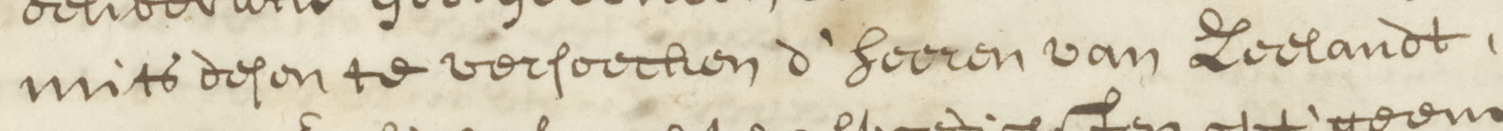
mitsdesen te versoecken d'heeren van Zeelandt,
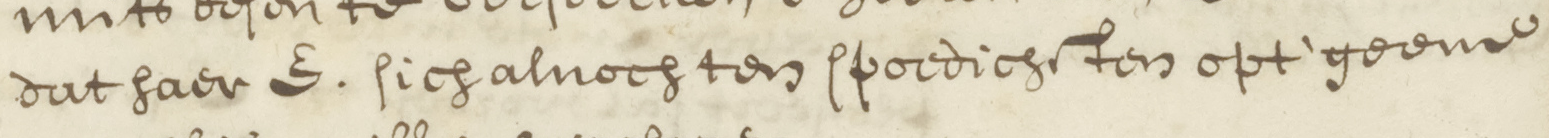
dat haer E. sich alnoch ten spoedichsten opt' geene
